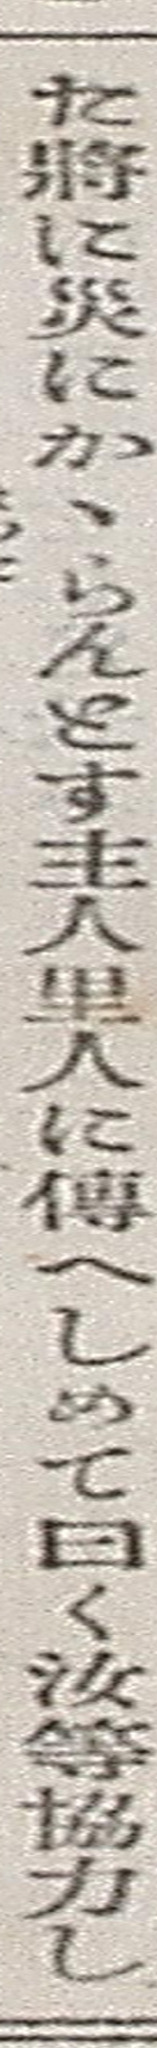た将に災にかゝらんとす主人里人に伝へしめて曰く汝等協力し
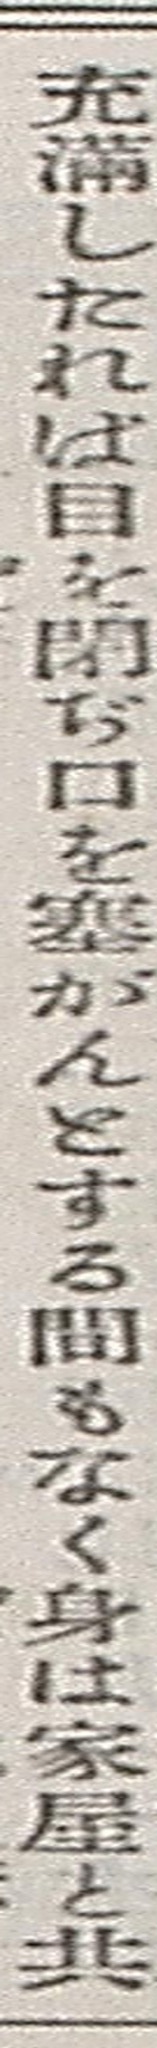充満したれば目を閉ぢ口を塞がんとする間もなく身は家屋と共
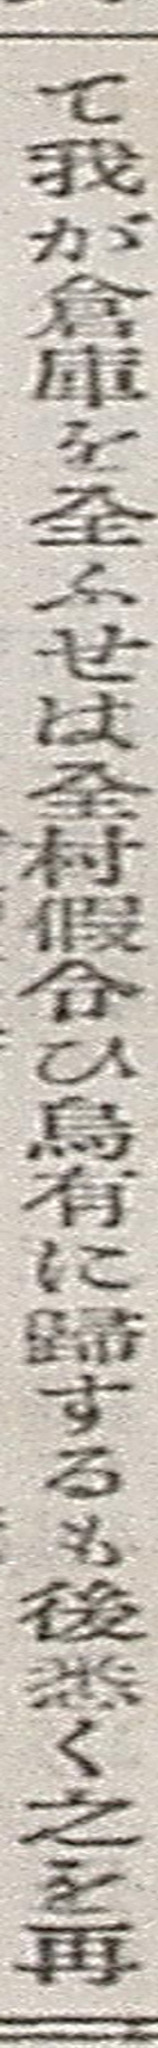て我が倉庫を全ふせは全村仮令ひ烏有に帰するも後悉く之を再
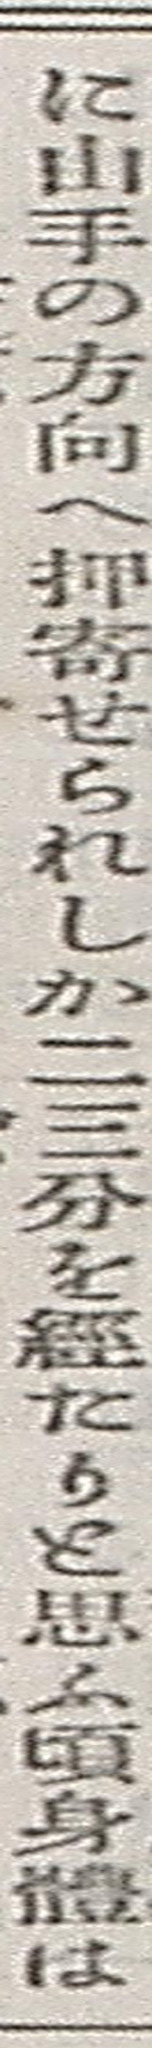に山手の方向へ押寄せられしか二三分を経たりと思ふ頃身体は
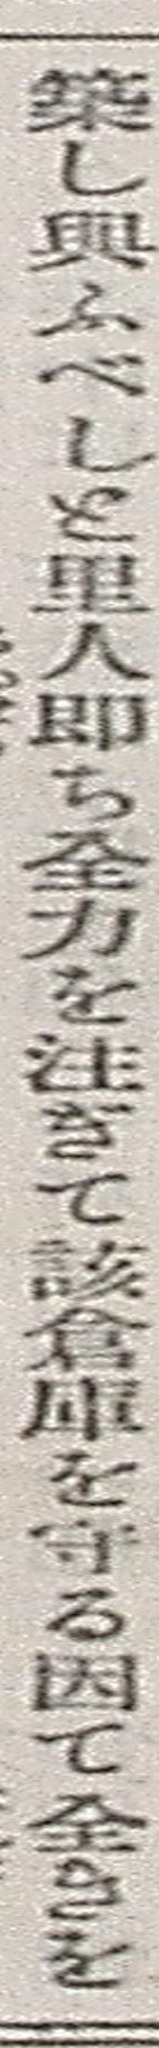築し与ふべしと里人即ち全力を注ぎて該倉庫を守る因て全きを
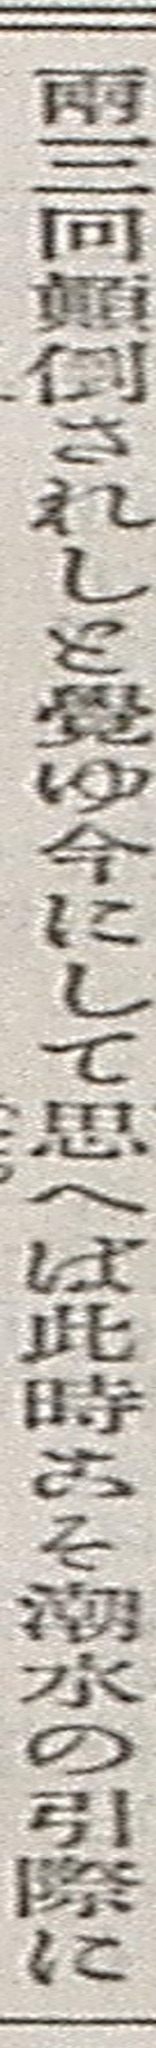両三回顛倒されしと覚ゆ今にして思へば此時こそ潮水の引際に
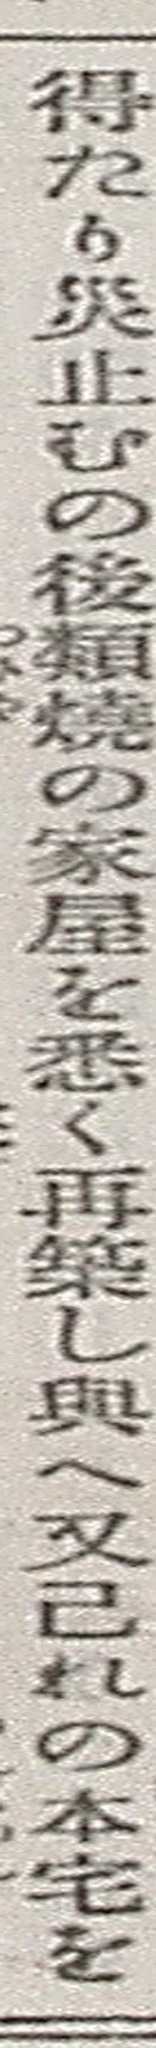得たり災止むの後類焼の家屋を悉く再築し与へ又己れの本宅を
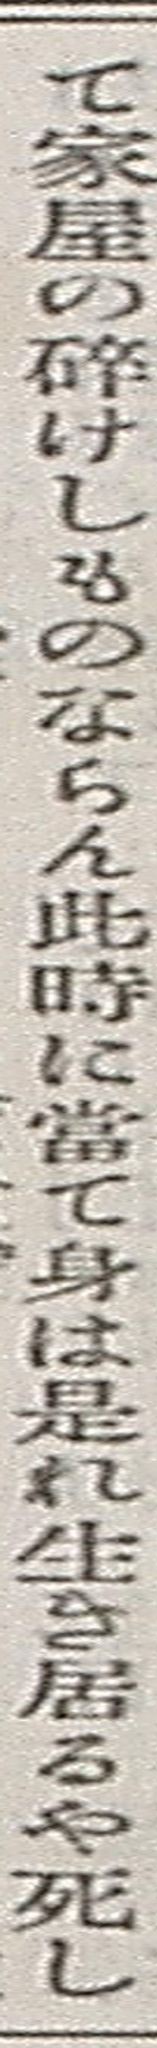て家屋の砕けしものならん此時に当て身は是れ生き居るや死し
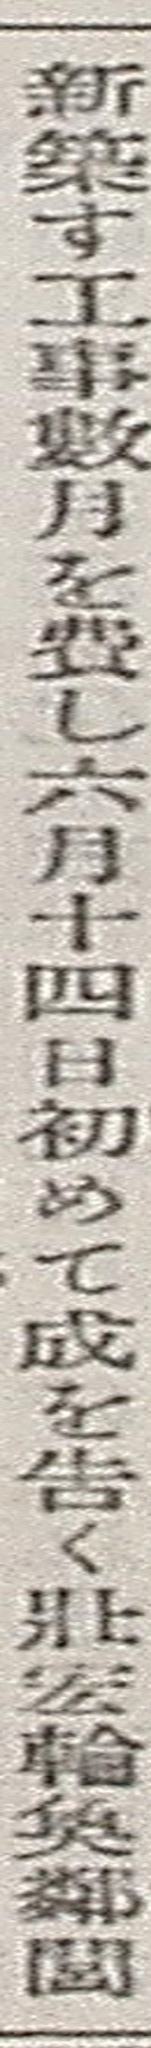新築す工事数月を費し六月十四日初めて成を告く壮宏輪奐鄰閭
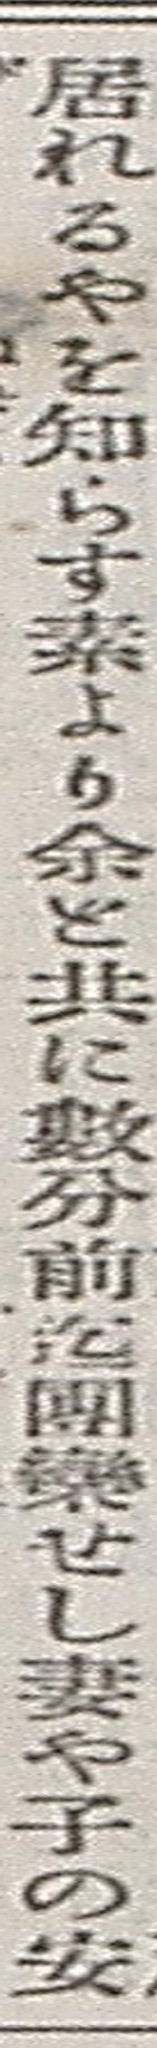居れるやを知らす素より余と共に数分前迄団欒せし妻や子の安
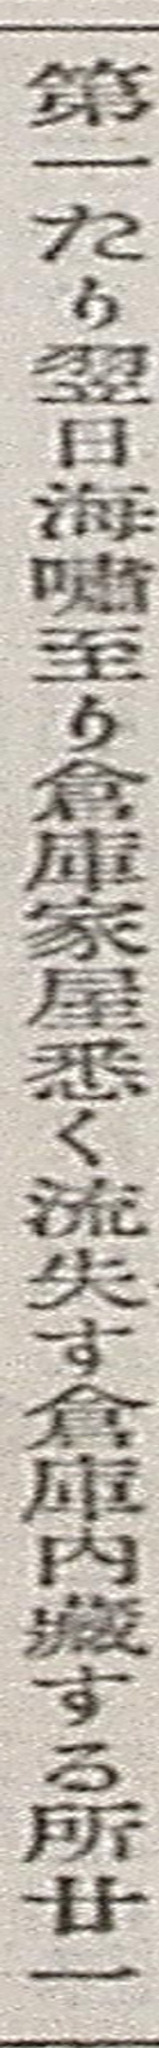第一たり翌日海嘯至り倉庫家屋悉く流失す倉庫内蔵する所廿一
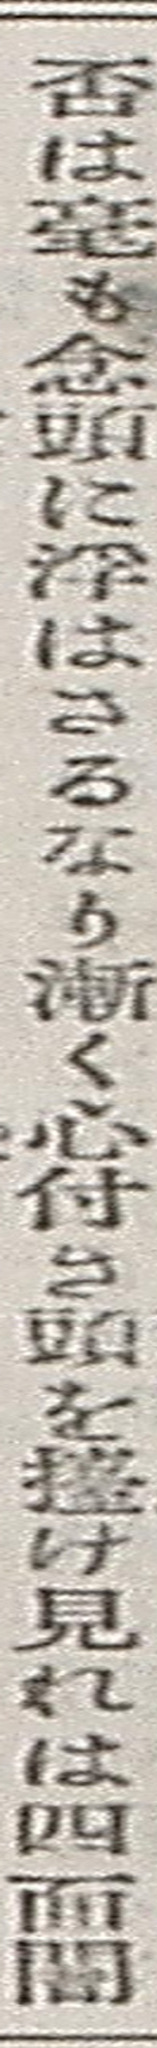否は毫も念頭に浮はさるなり漸く心付き頭を擡け見れは四面闇
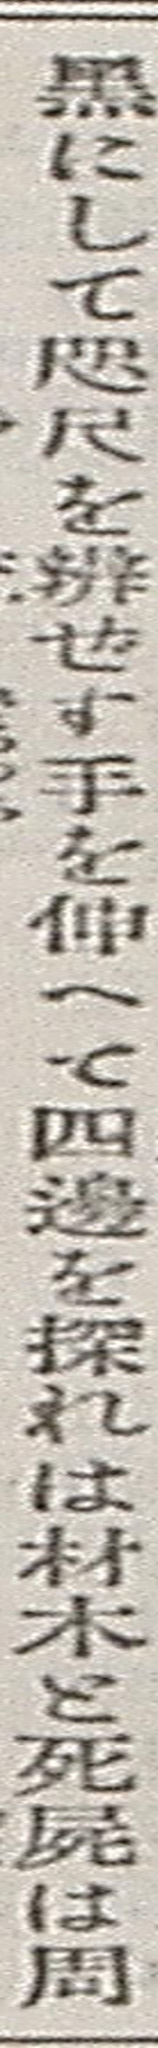黒にして咫尺を弁ぜず手を伸へて四辺を探れは材木と死屍は周
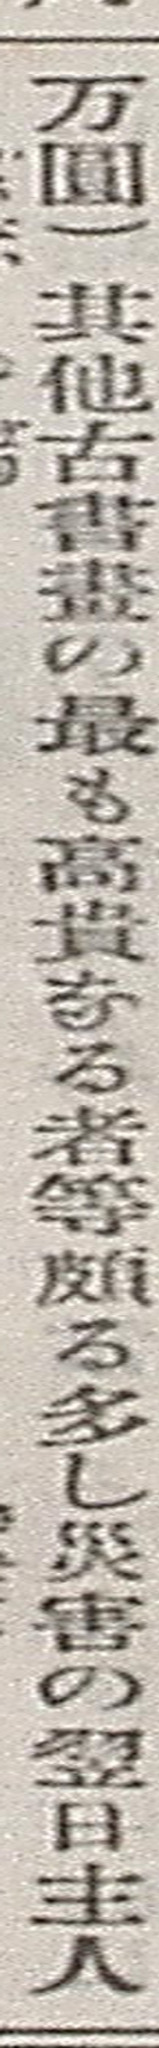万円）其他古書画の最も高貴なる者等頗る多し災害の翌日主人
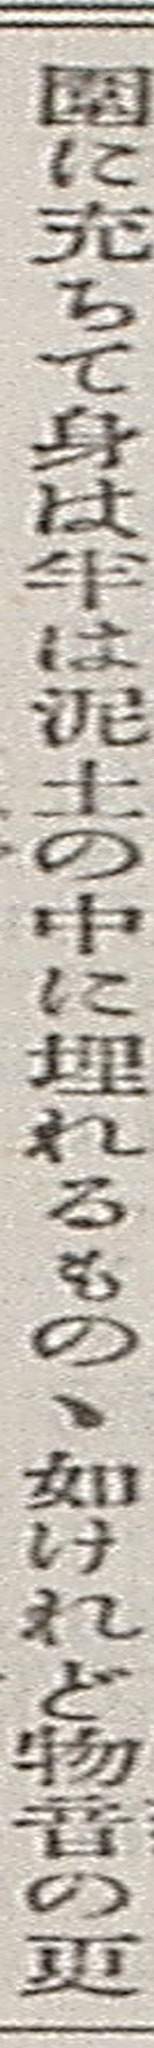囲に充ちて身は半は泥土の中に埋れるものゝ如けれど物音の更
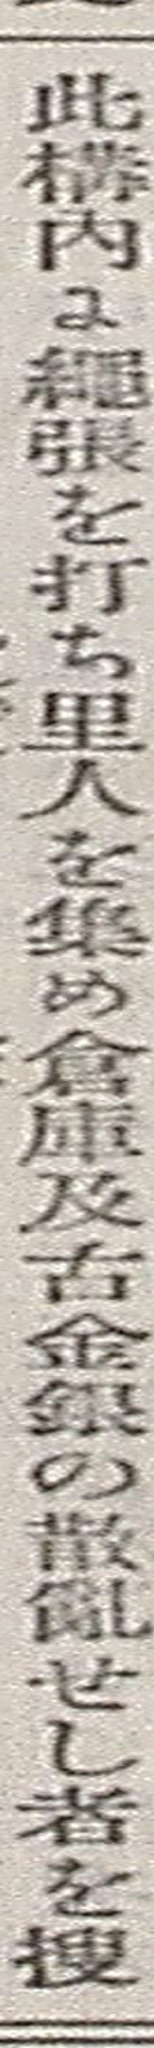此構内に縄張を打ち里人を集め倉庫及古金銀の散乱せし者を捜
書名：風俗畫報臨時増刊第百二十號　大海嘯被害録（下）
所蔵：東京大学地震研究所図書室 Earthquake Research Institute Library, The University of Tokyo, JAPAN
